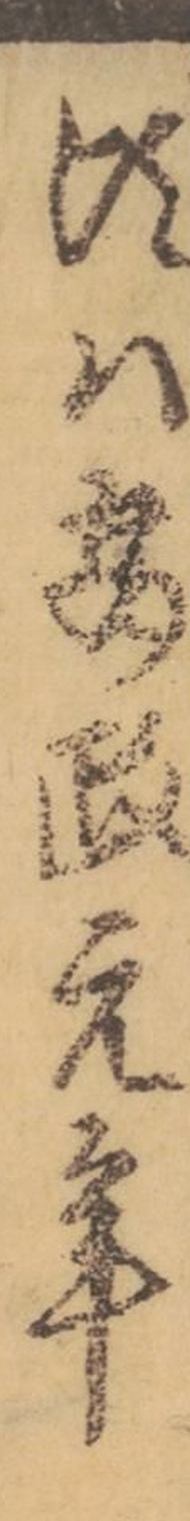頃は安政元年
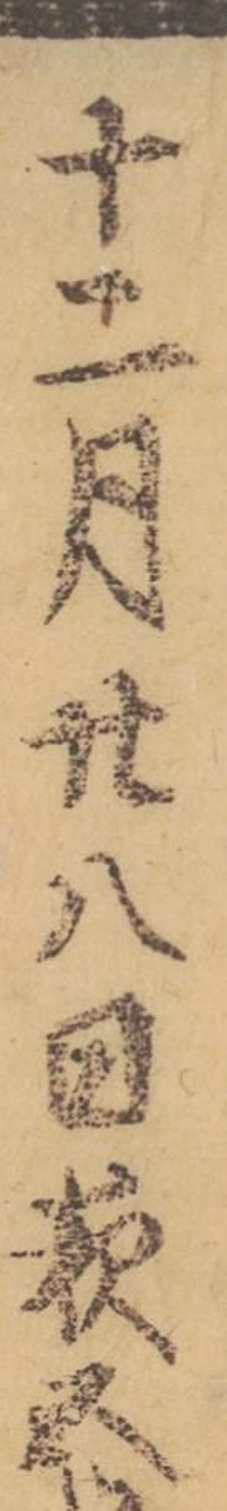十二月廿八日夜五ッ
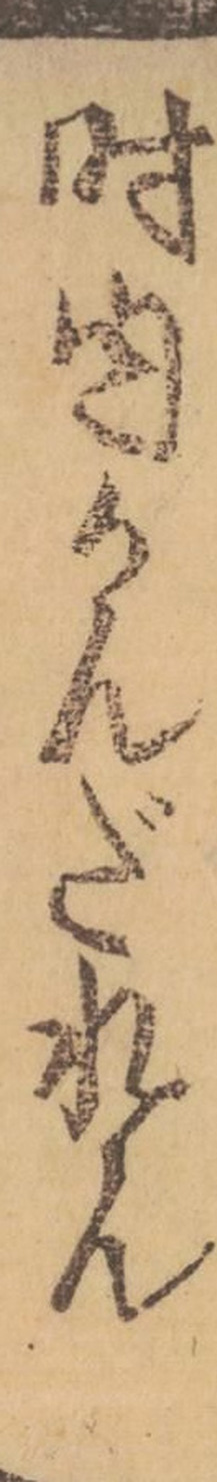時内かんだれん
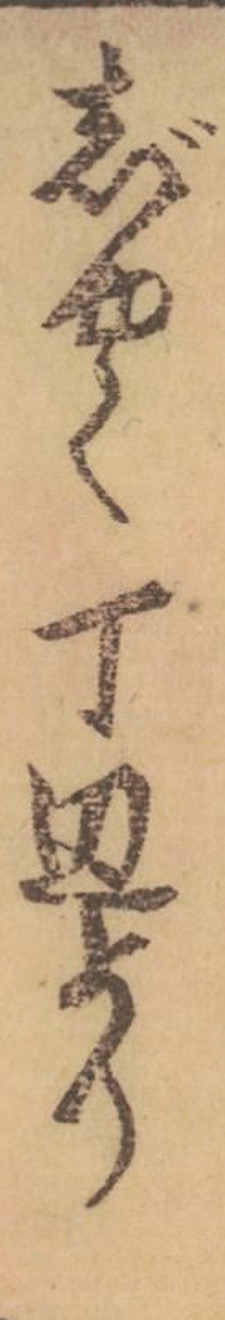じやく丁辺より
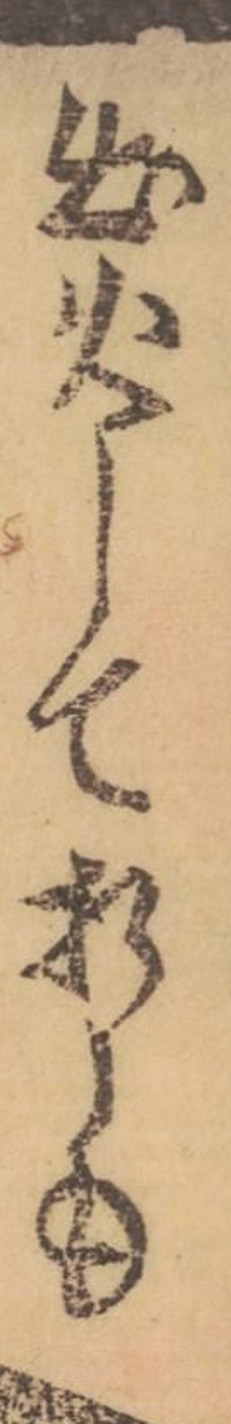出火して折しも
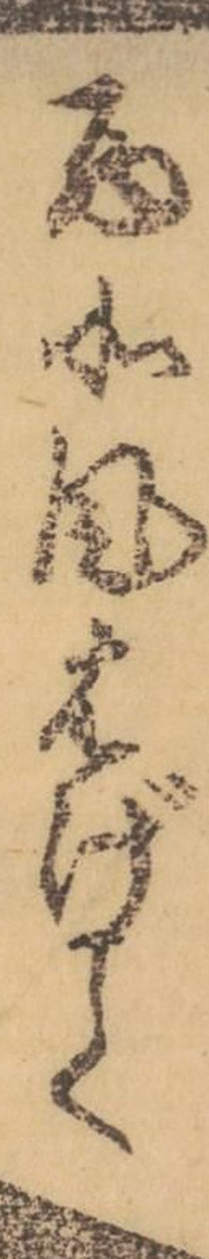西北風はげしく
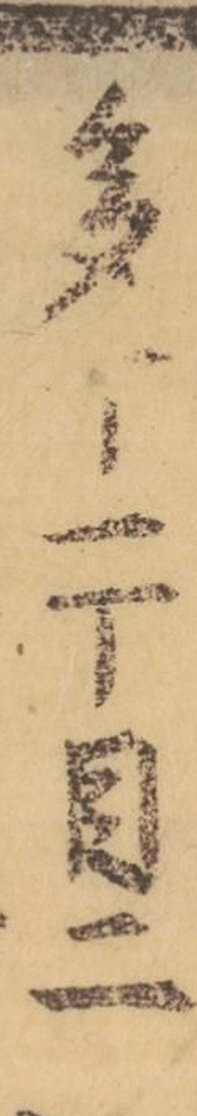多丁一丁目二
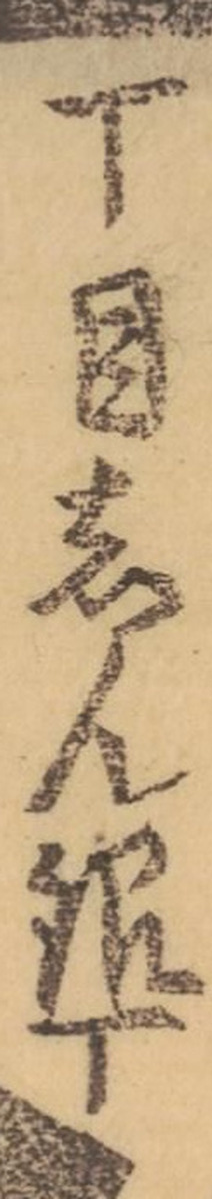丁目しん銀丁
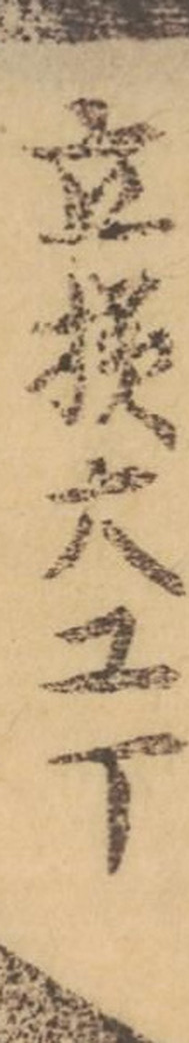立横大工丁
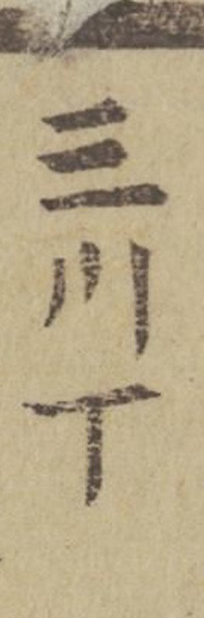三川丁
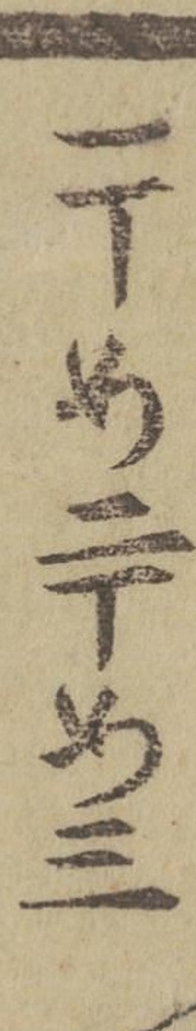一丁め二丁め三
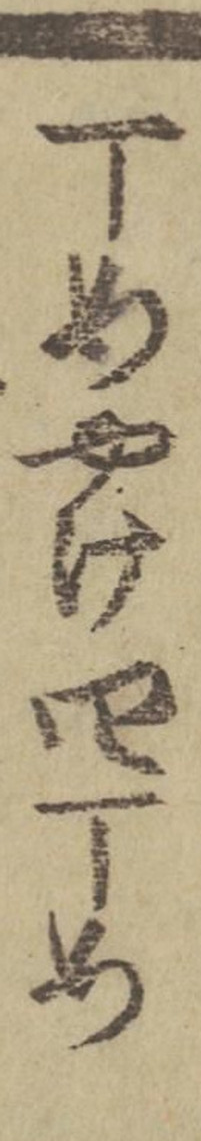丁めやけ四丁め
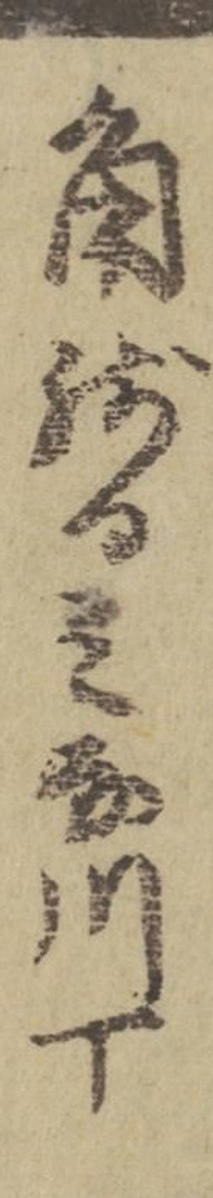角残るみな川丁
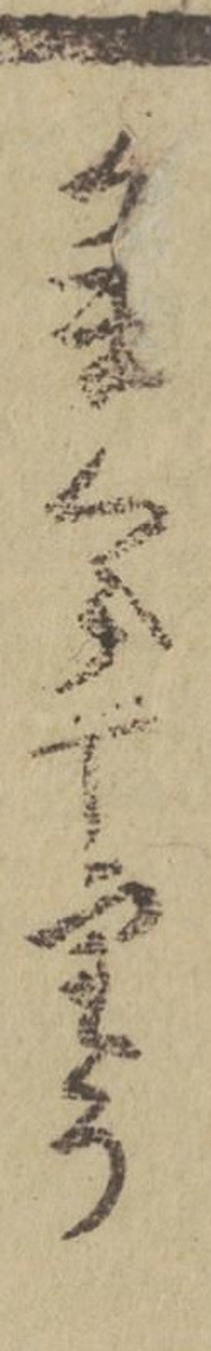かまくら丁りう
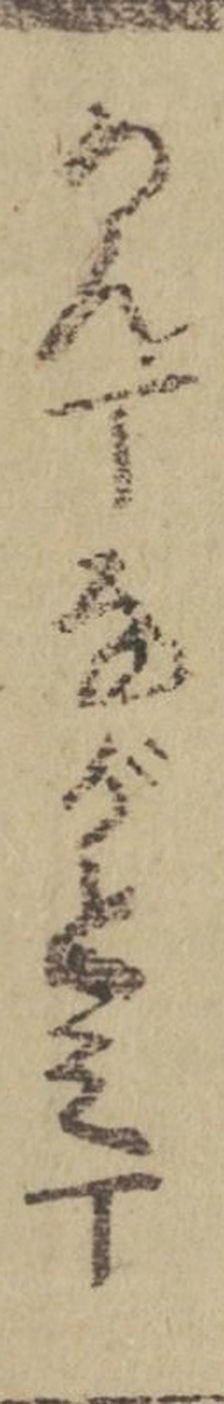かん丁ながとみ丁
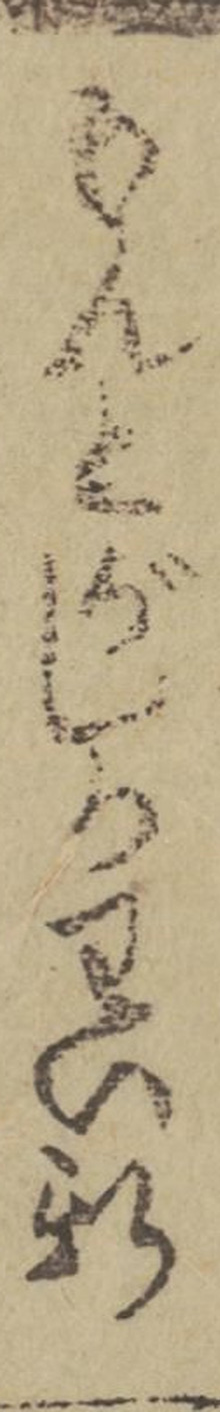もんどがしかわい新
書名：[安政元年十二月の江戸大火に関する瓦版]
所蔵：東京大学地震研究所図書室 Earthquake Research Institute Library, The University of Tokyo, JAPAN
